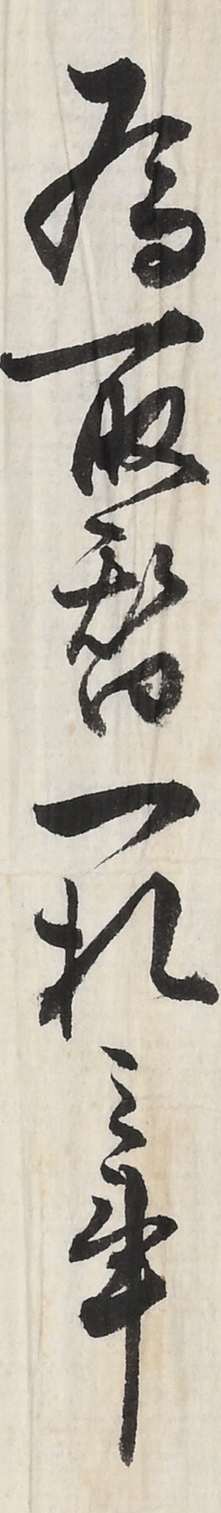為取替一札之事
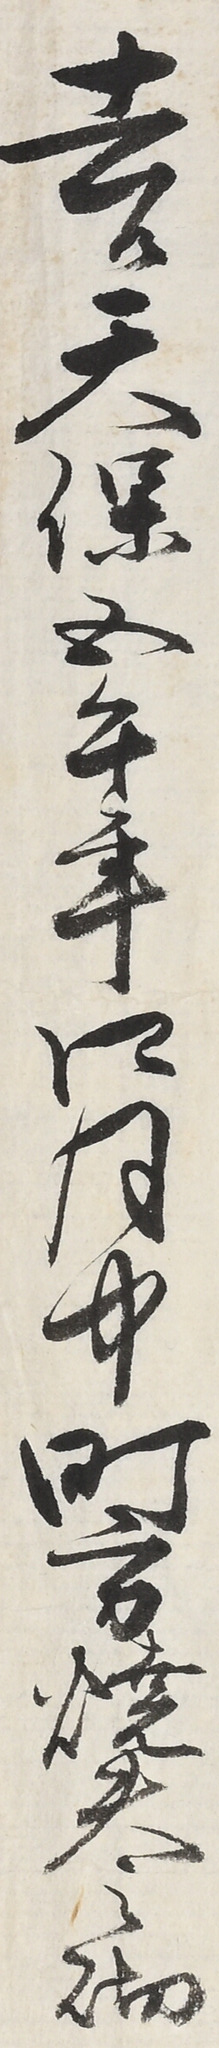去ル天保五午年四月中町方焼失之砌
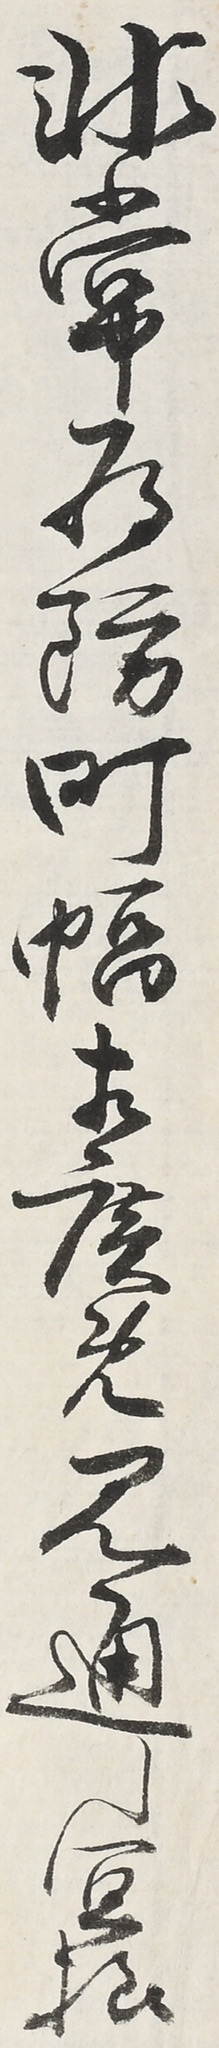非常為防町幅相広め見通し宜様
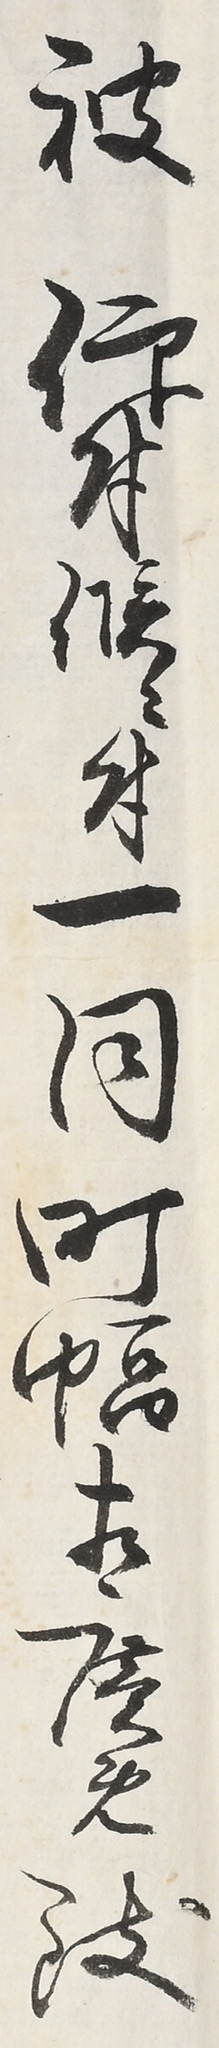被仰付候ニ付一同町幅相広め致
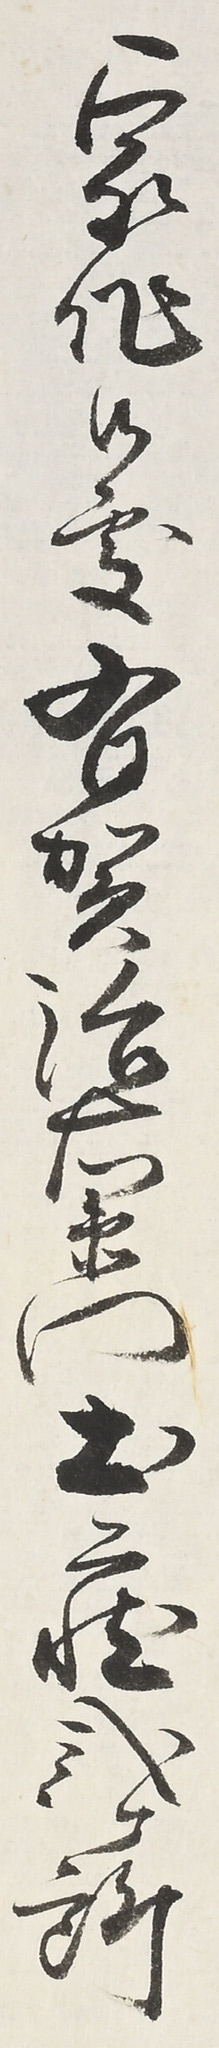家作候処有賀治右衛門土蔵弐ヶ所
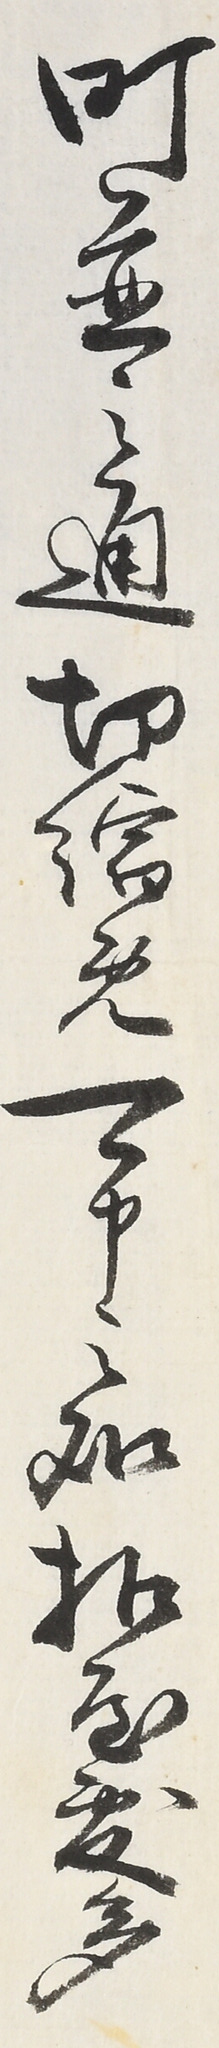町並之通切縮め可申候処扣屋敷多
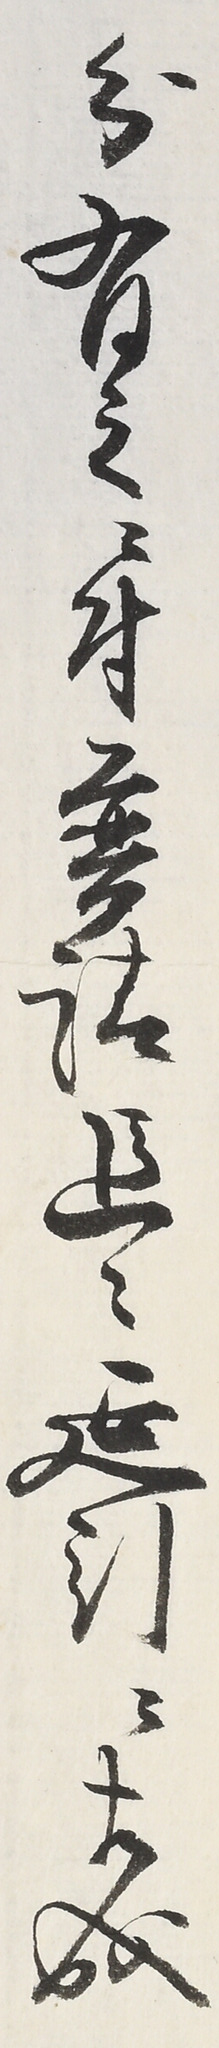分有之ニ付普請追々延引ニ相成
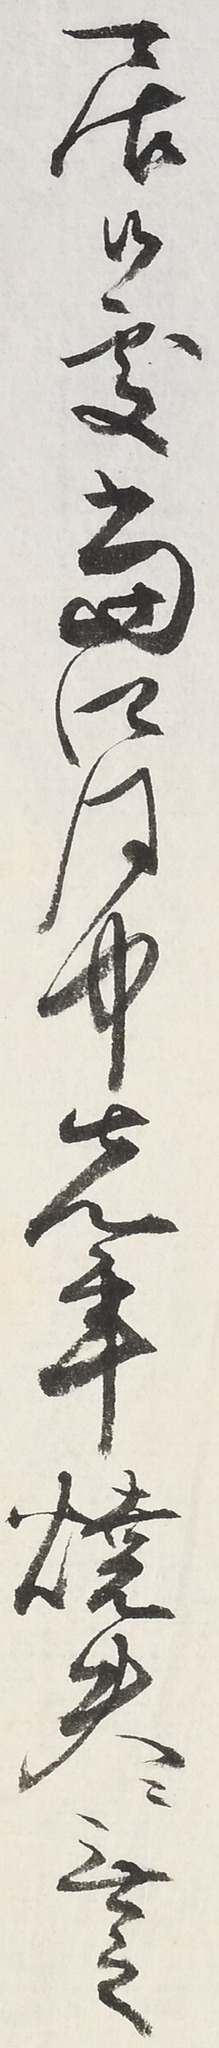居候処当四月中先年焼失ニ無之
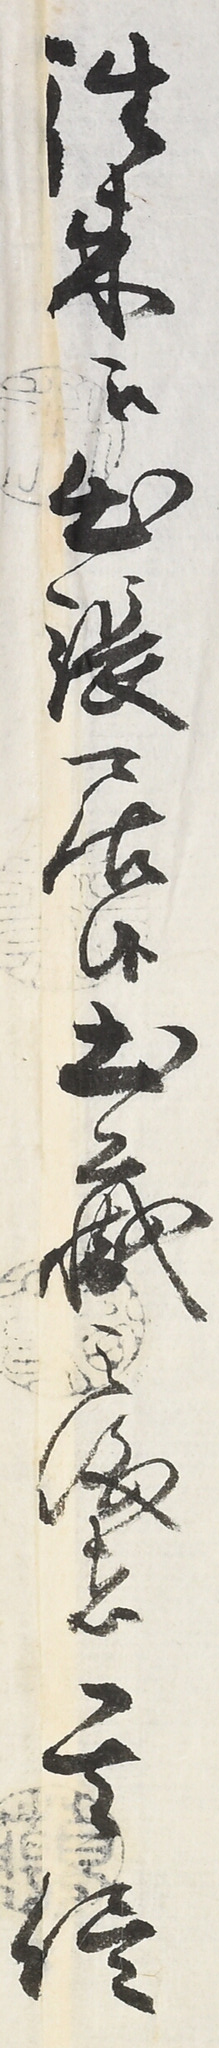往来江出張居候土蔵之儀者其侭
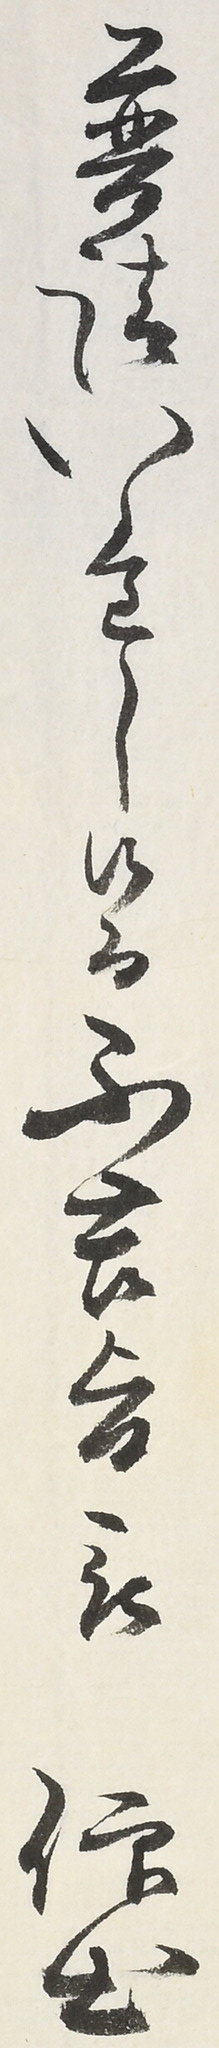普請いたし候而不苦旨被仰出
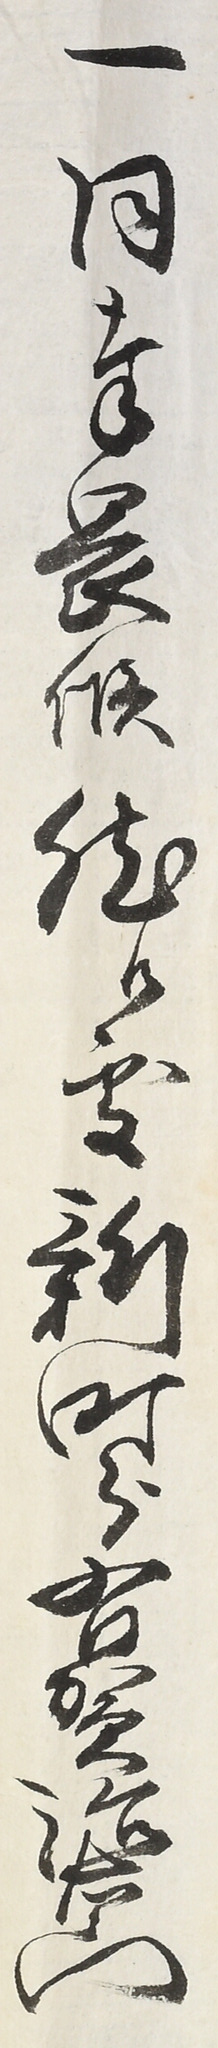一同奉畏候然ル処新町分有賀治右衛門
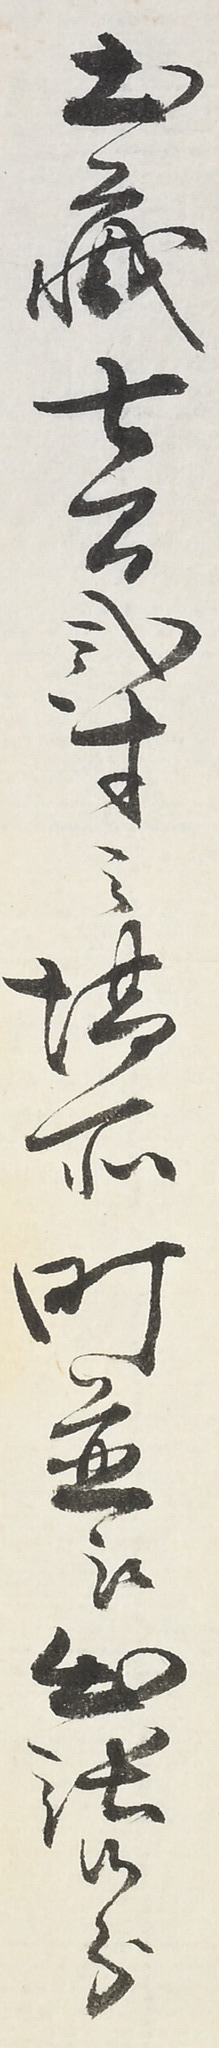土蔵七間弐寸之場所町並江出張候分
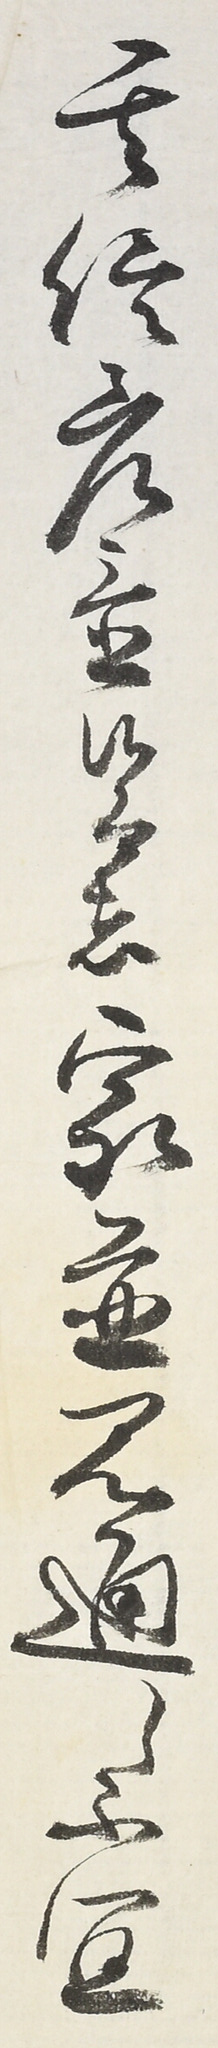其侭差置候而者家並見通し不宜
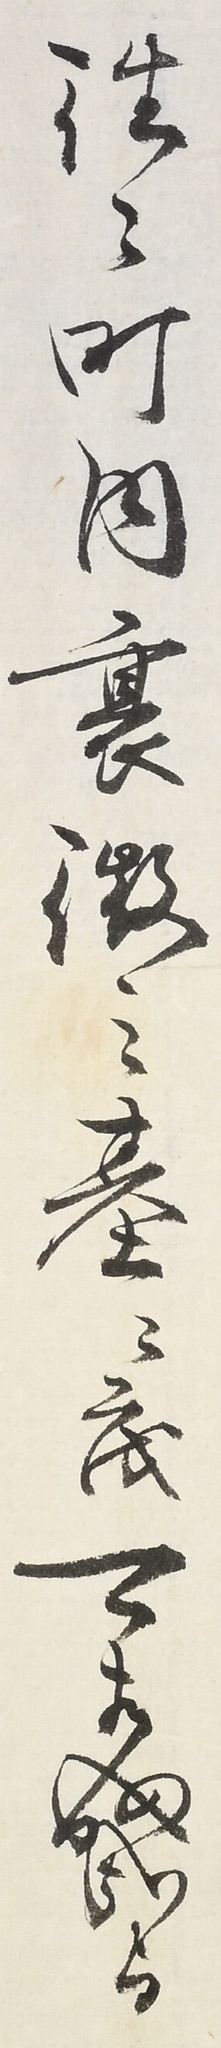往々町内衰微之基ニ茂可相成哉与
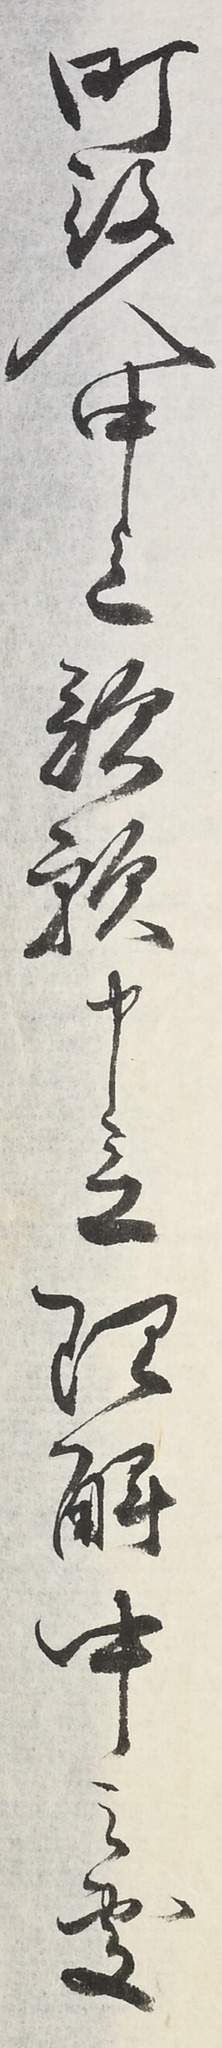町役人中迄歎願申立理解中之処
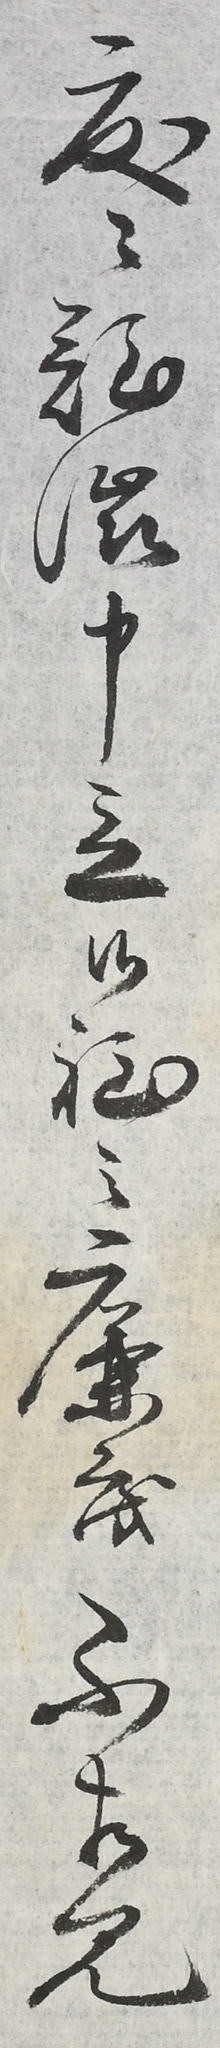度々難渋申立候程之廉茂不相見
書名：為取替一札之事
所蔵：伊那市立高遠町図書館・合同会社AMANE
